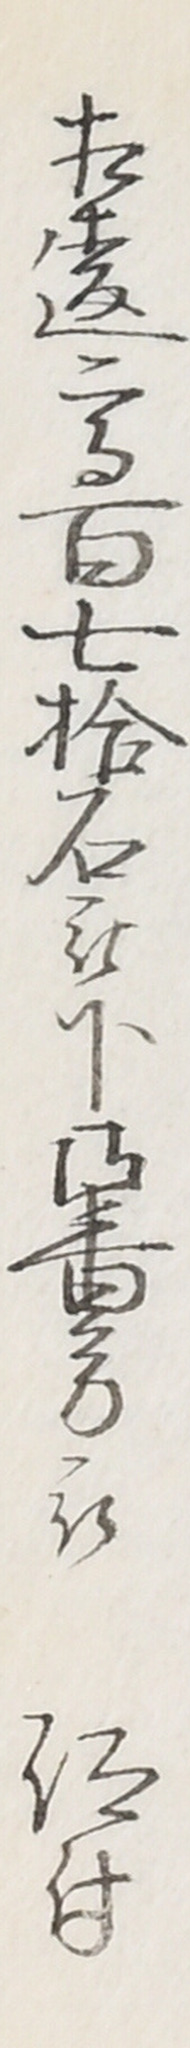相違高百七拾石被下御番方被仰付
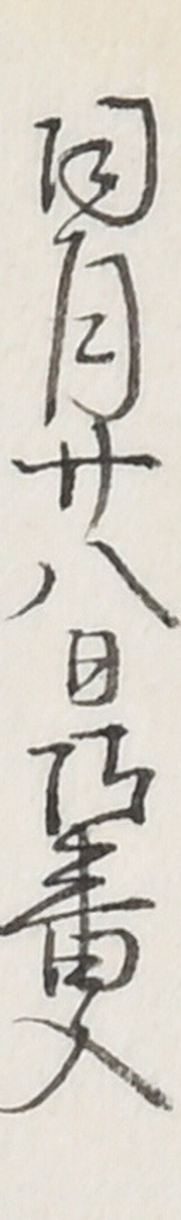同月廿八日御番入
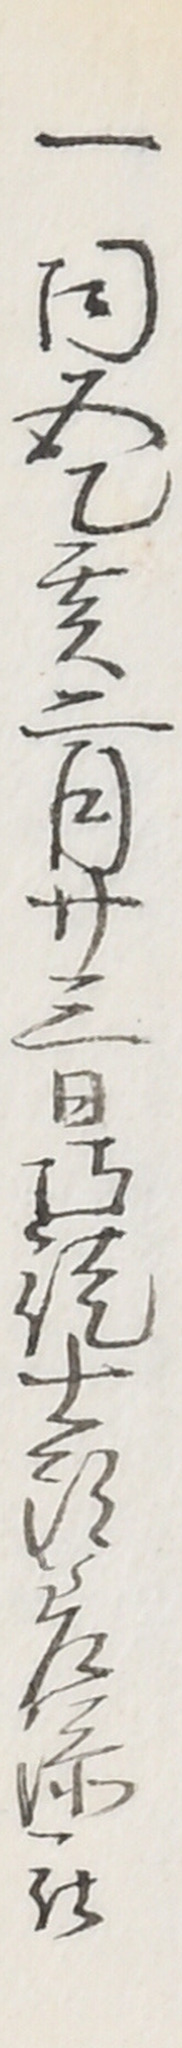一同五乙亥二月廿三日御徒士頭差添被
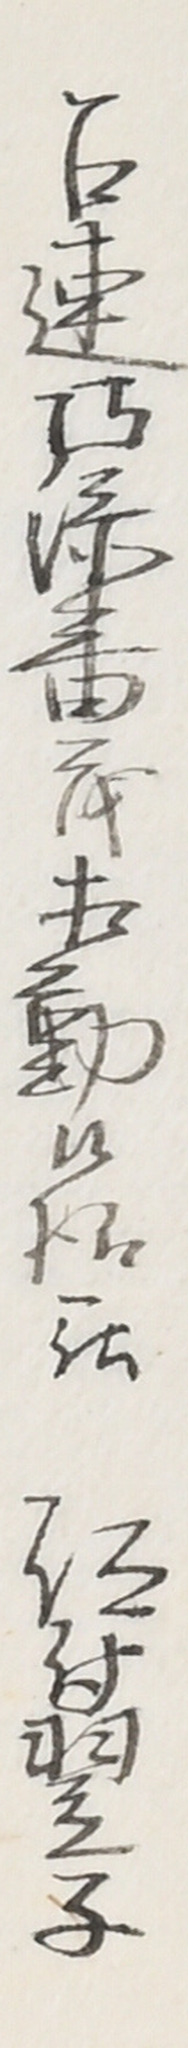召連御添番も勤候様被仰付翌子
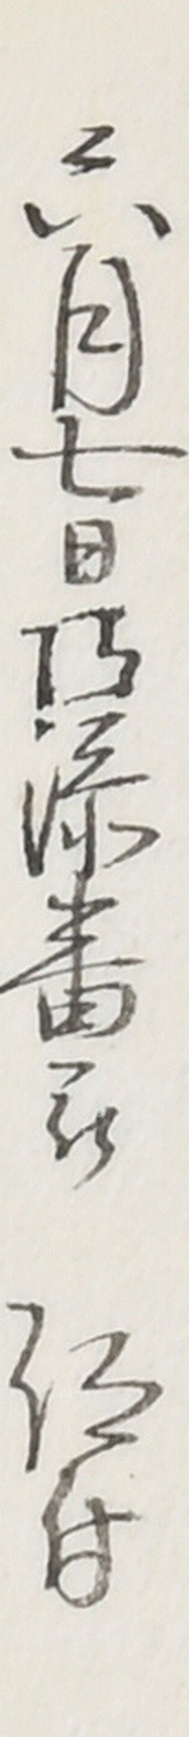六月七日御添番被仰付
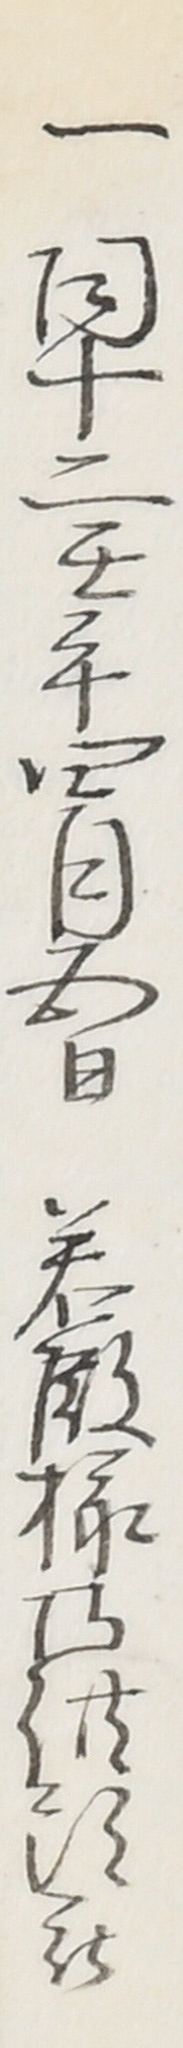一同十二壬午四月五日若殿様御供頭被
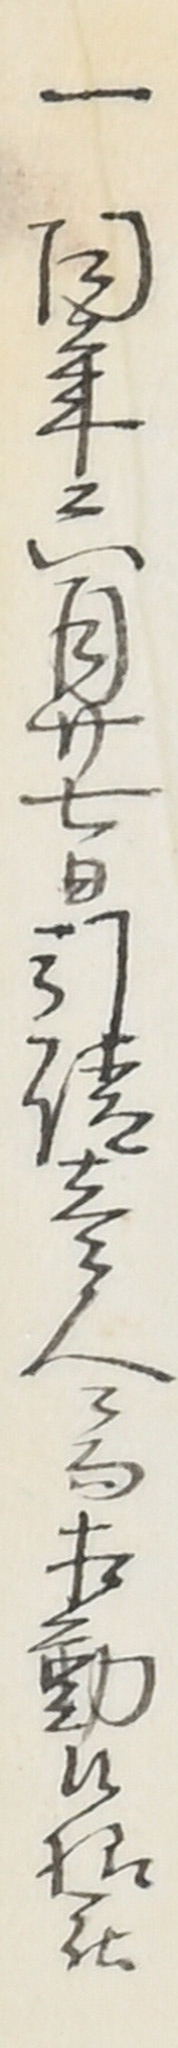一同年六月廿七日引請壱人ニ而相勤候様被
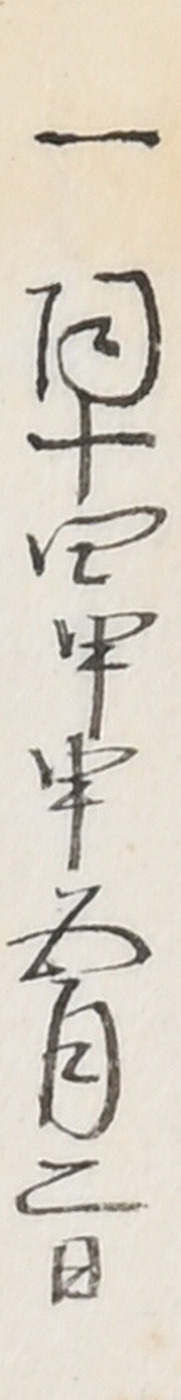一同十四甲申五月二日
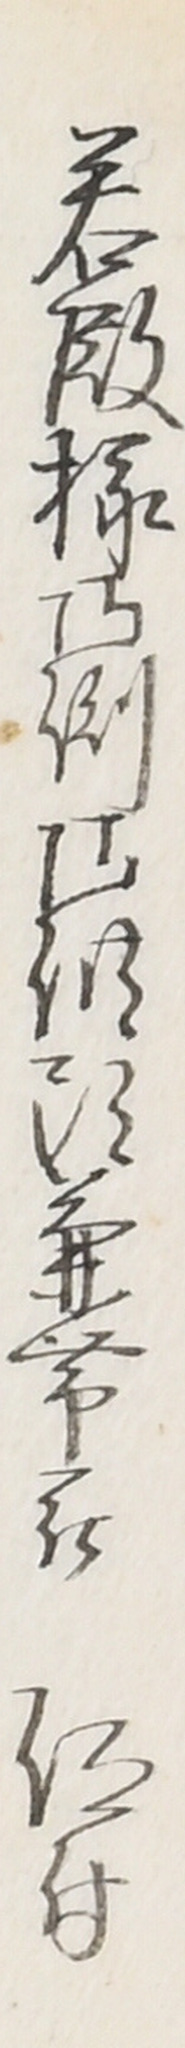若殿様御側御供頭兼帯被仰付
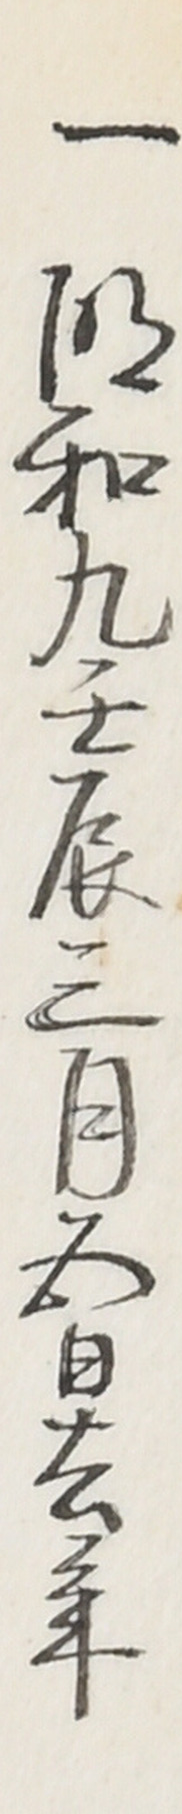一明和九壬辰三月五日去年
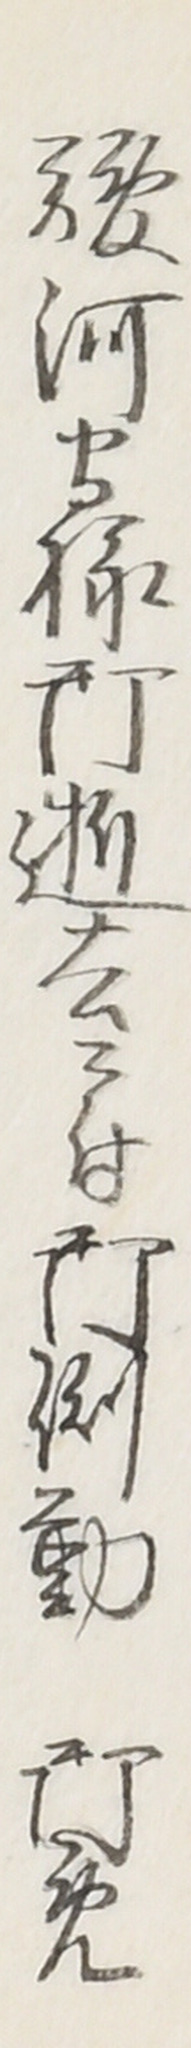駿河守様御逝去ニ付御側勤御免
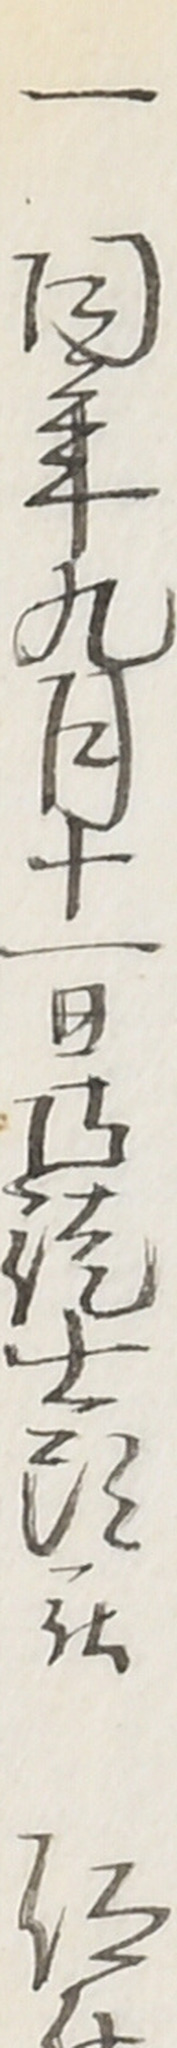一同年九月十一日御徒士頭被仰付
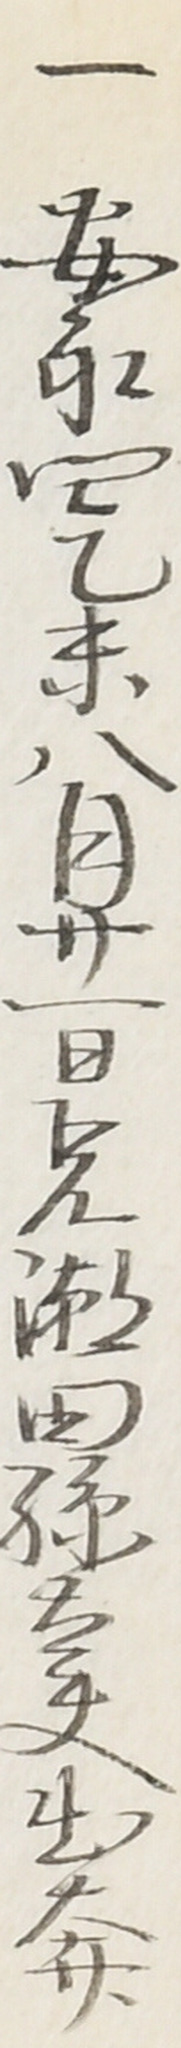一安永四乙未八月廿一日兄瀬田孫太夫出奔
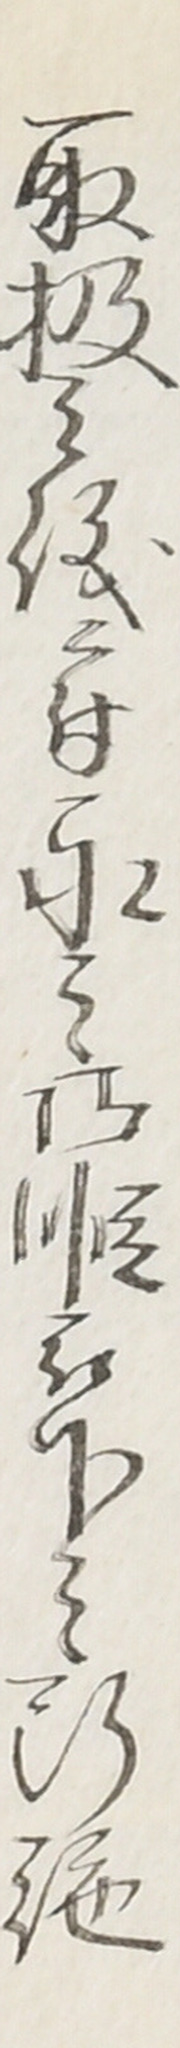取扱之儀ニ付永之御暇被下之断絶
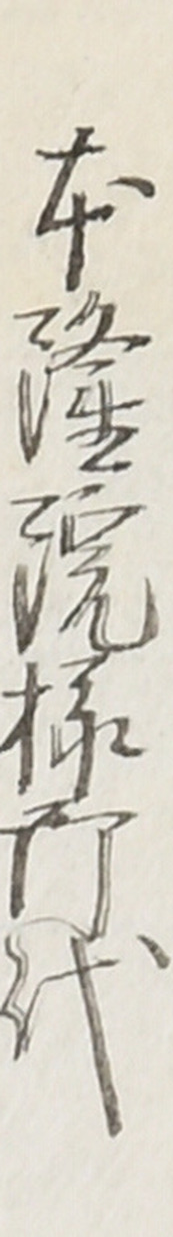本隆院様御代
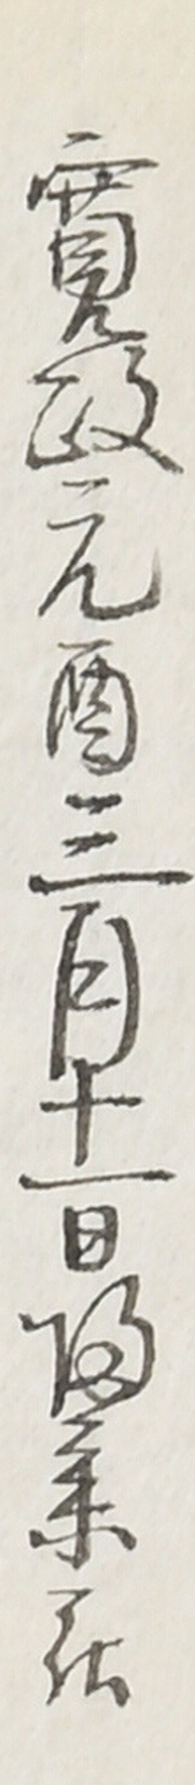一寛政元酉三月十一日帰参被
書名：給人諸士勤仕録（七）
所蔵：伊那市立高遠町図書館・合同会社AMANE
